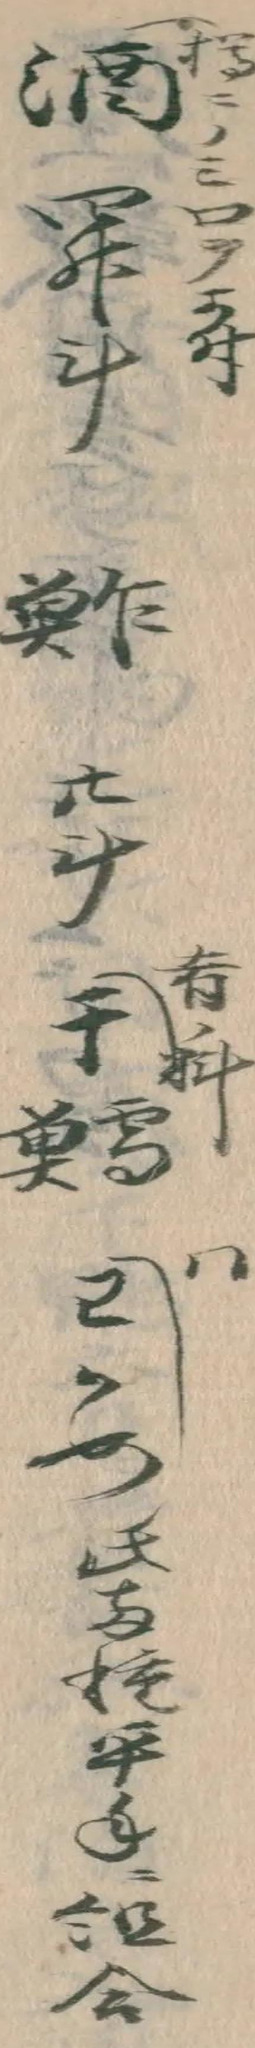酒四升計鮓廿計干鱈わかめ氏両種平手ニ組合
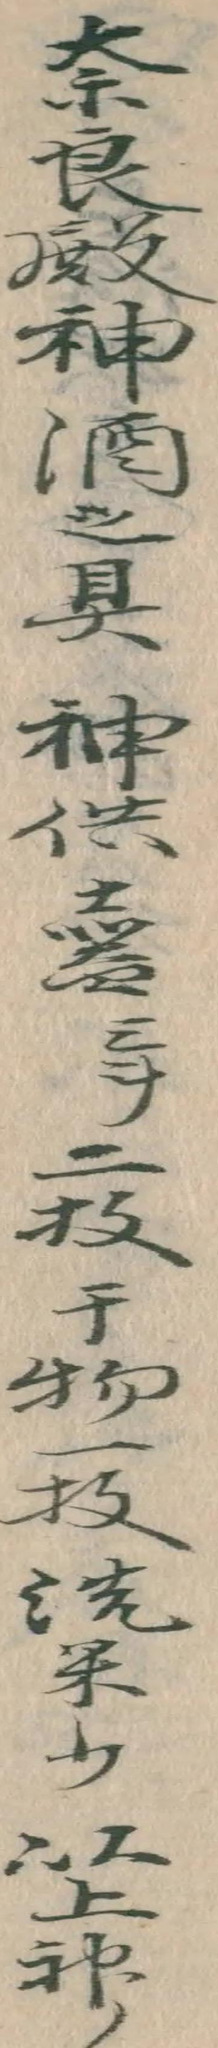奈良殿神酒之具神供土器三計二枚干物一枚洗米少以上神ノ
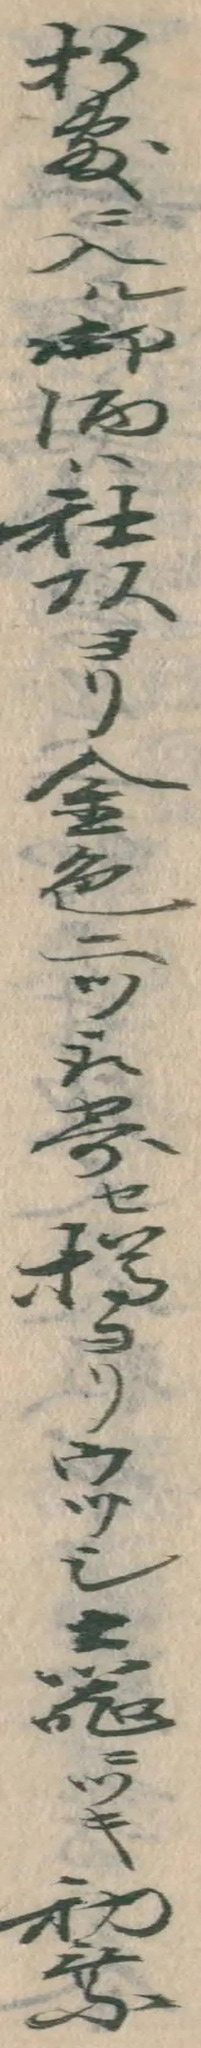折敷ニ入ル御酒ハ社頭ヨリ金色二ツ取寄セ樽ヨリウツシ土器ニツキ初乗
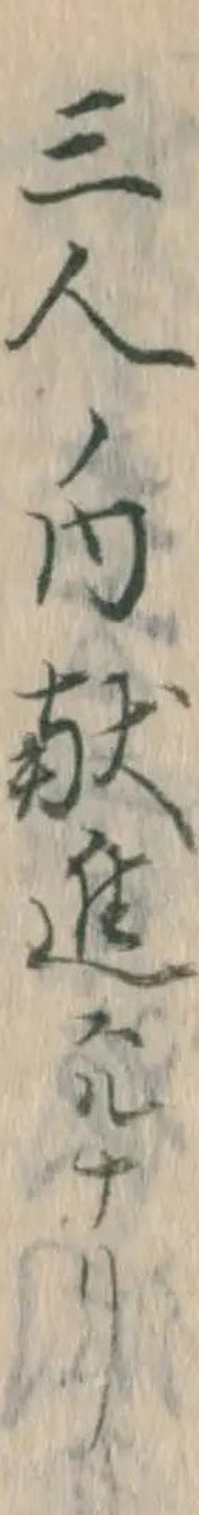三人ノ内献進スルナリ
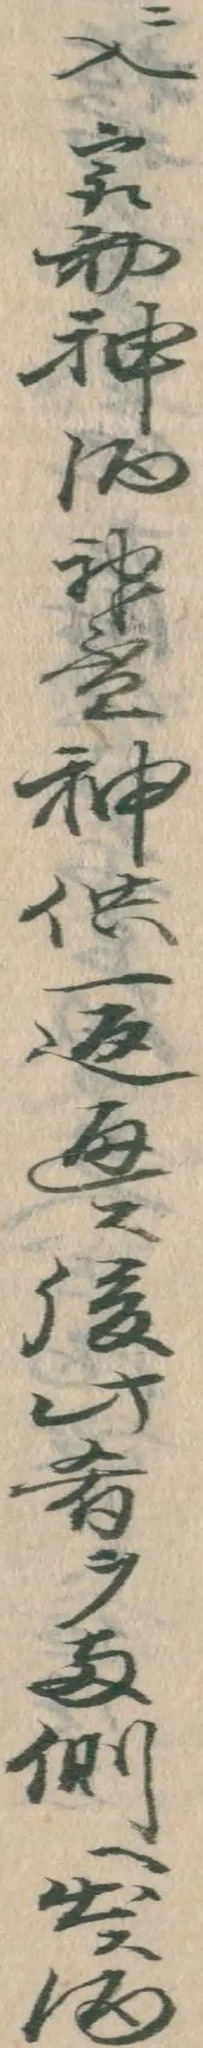ニ入最初神酒神霊神供一返通ス後此肴ヲ両側へ出ス酒
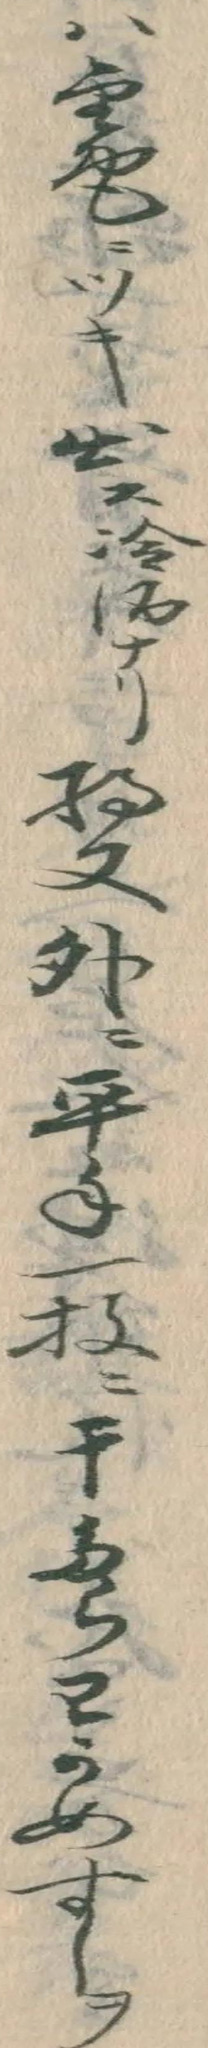ハ金色ニツキ出ス冷酒ナリ将又外ニ平手一枚ニ干たらわかめすしヲ
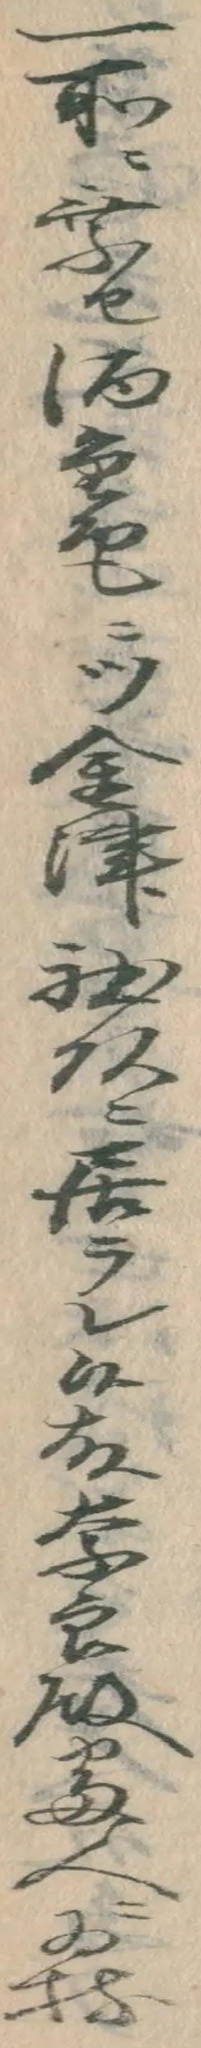一所ニ乗セ酒金色ニツ金津社頭ニ居ラレ候故奈良殿番人ニ為抔

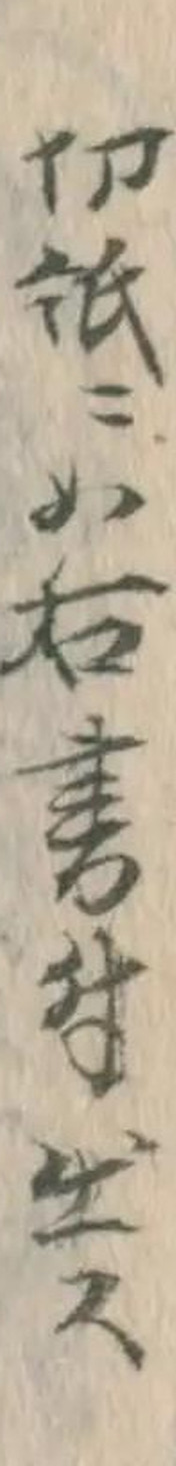切紙ニ如右書付出ス
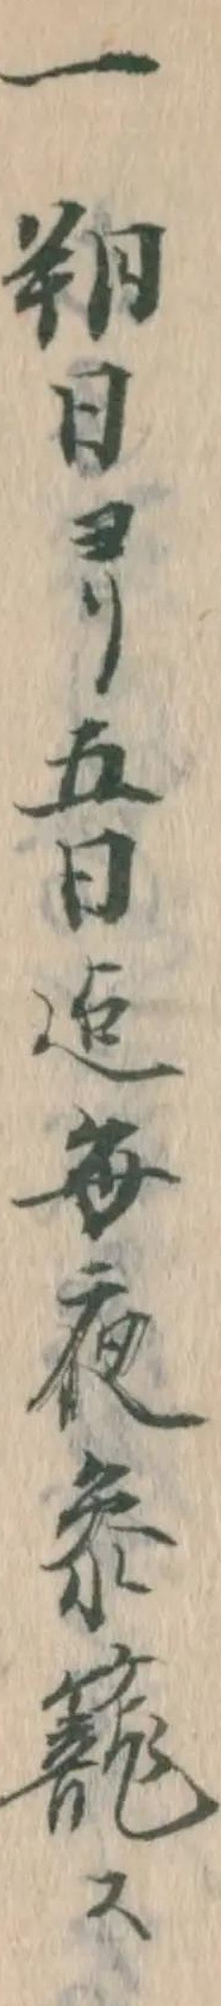一朔日ヨリ五日迄毎夜参籠ス
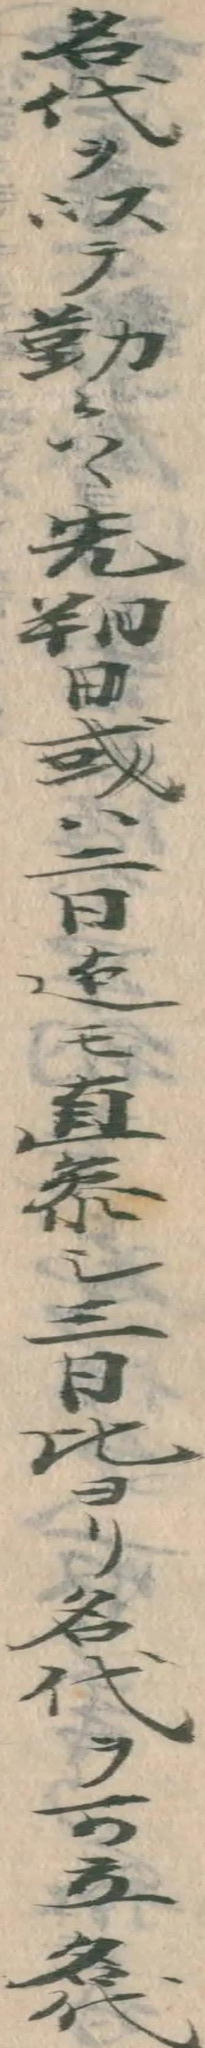名代ヲ以テ勤候ハヽ先朔日或ハ二日迄モ直参シ三日比ヨリ名代ヲ可立名代
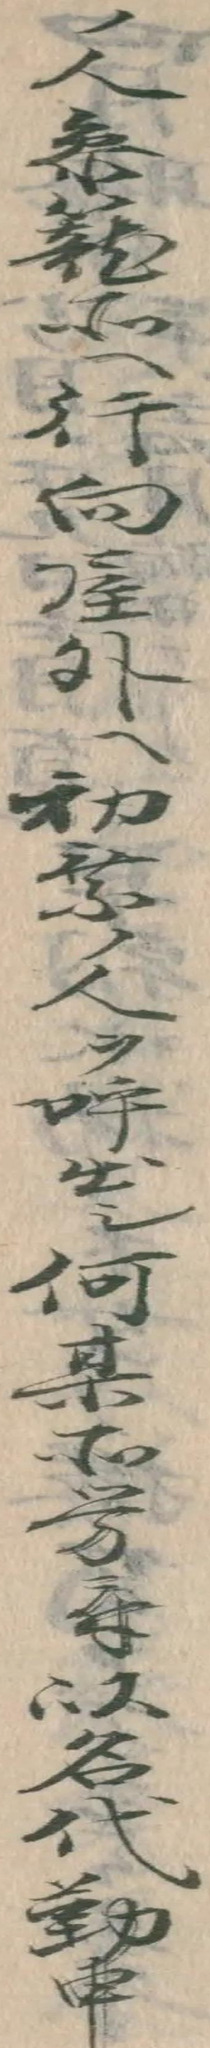ノ人参籠所へ行向屋外へ初乗ノ人ヲ呼出シ何某所労ニ付以名代勤申
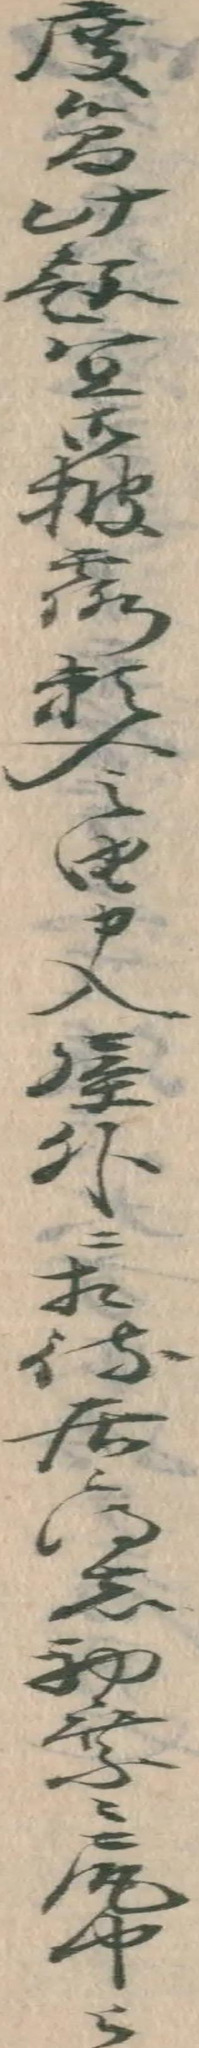度候間此趣宜御披露頼入之由申入屋外ニ相待居候得者初乗々尻中被
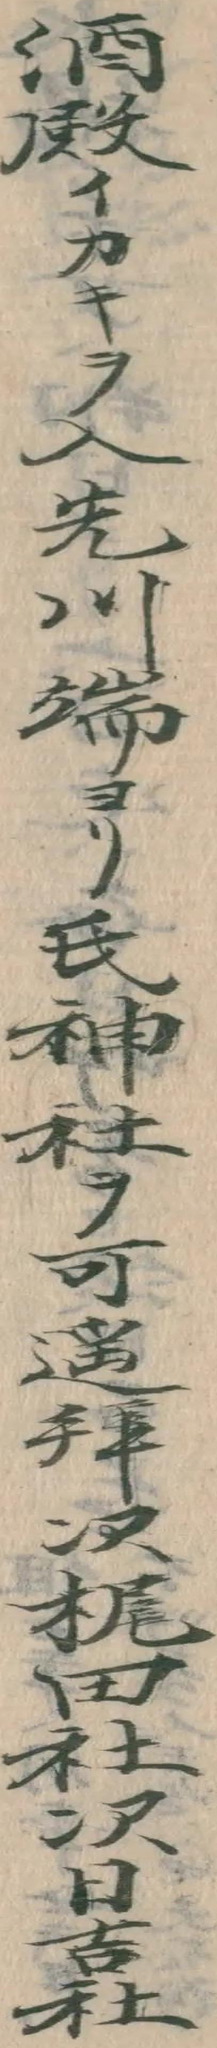酒殿イカキヲ入先川端ヨリ氏神社ヲ可遥拝次梶田社次日吉社
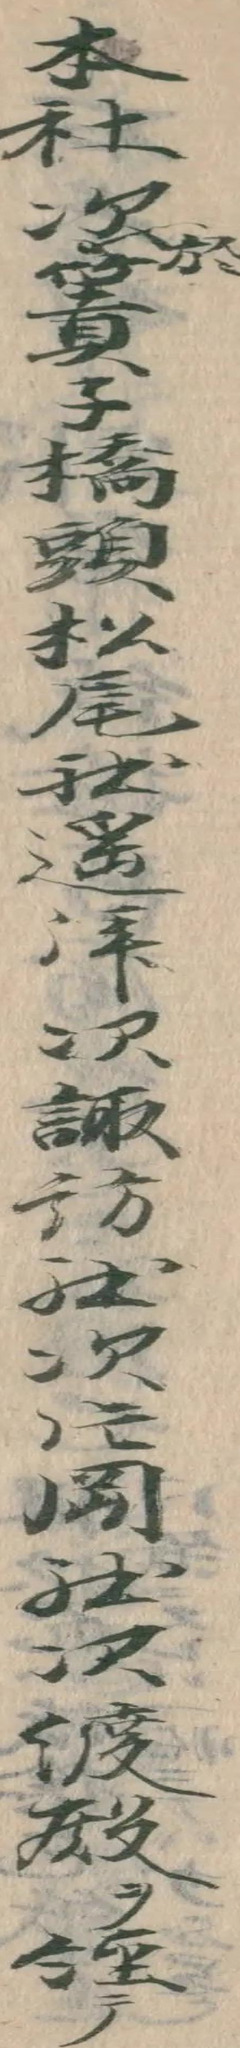本社次・簀子橋頭松尾社遥拝次諏訪社次片岡社次渡殿ヲ経テ
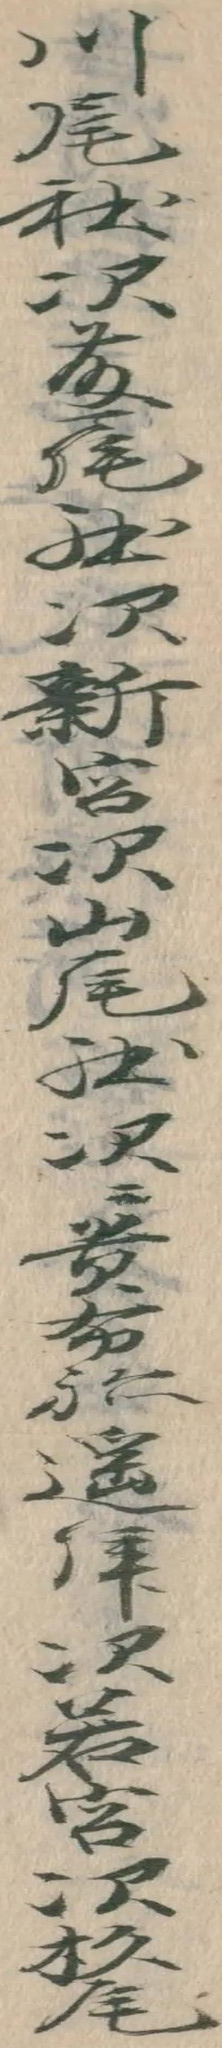川尾社次藤尾社次新宮次山尾社次ニ貴布禰遥拝次若宮次杉尾
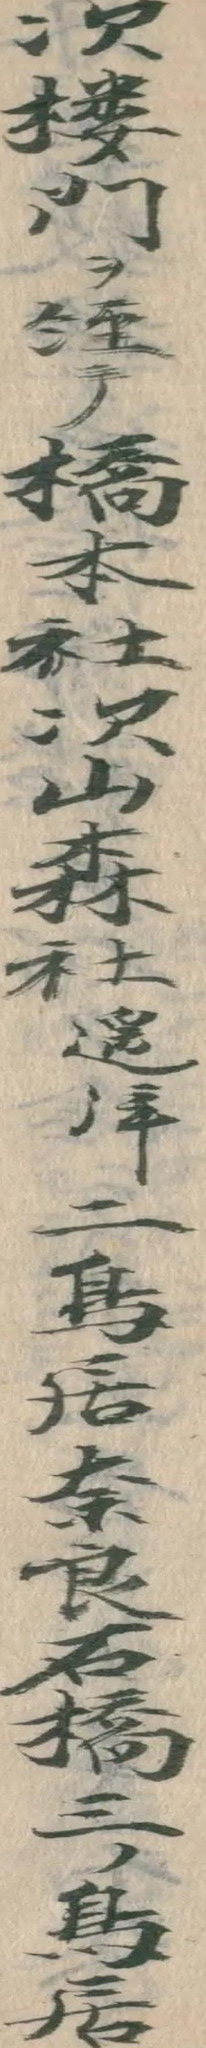次楼門ヲ経テ橋本社次山森社遥拝二鳥居奈良石橋三ノ鳥居
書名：賀茂社記録. 第11冊
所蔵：国立国会図書館 National Diet Library, JAPAN
